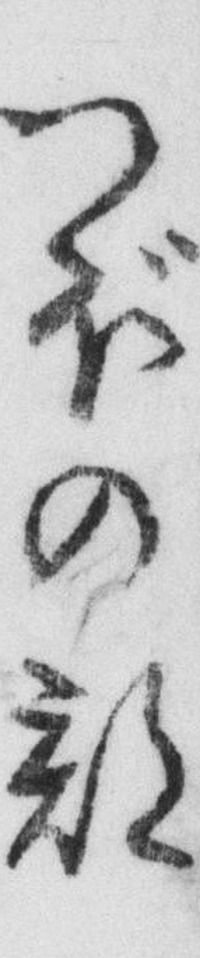つぼの部
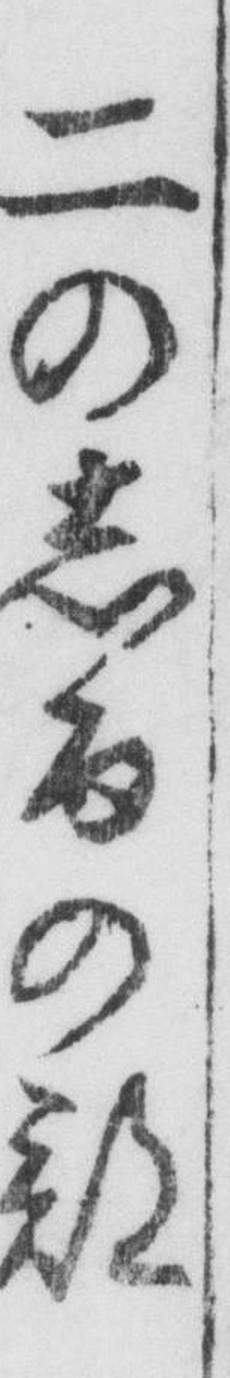二のしるの部
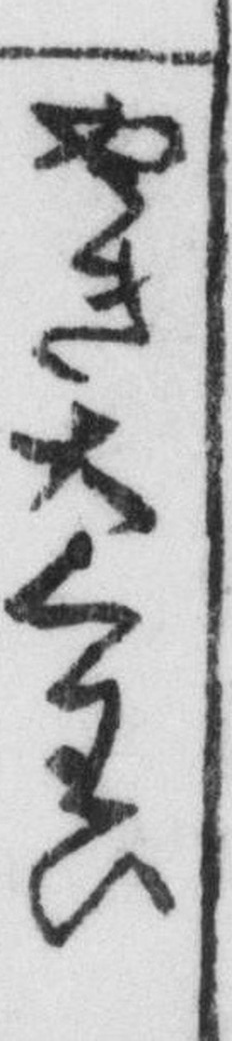やきよせくわい
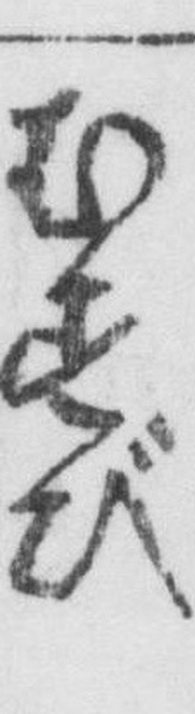むす也
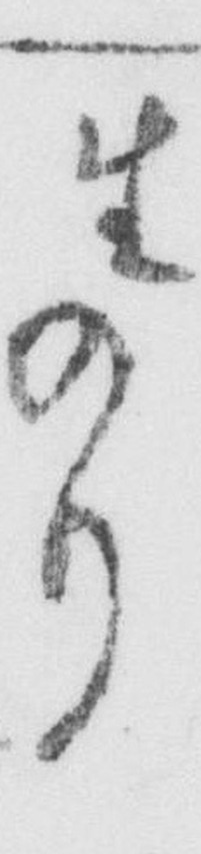生のり
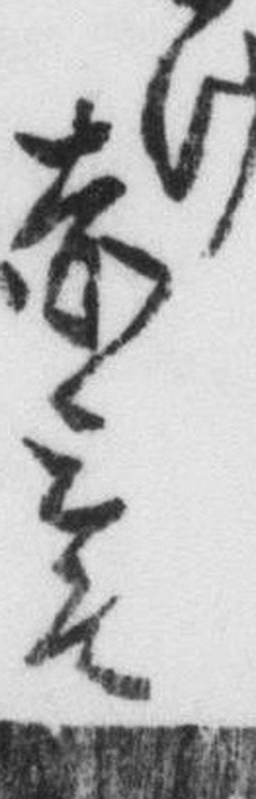鴨みそ
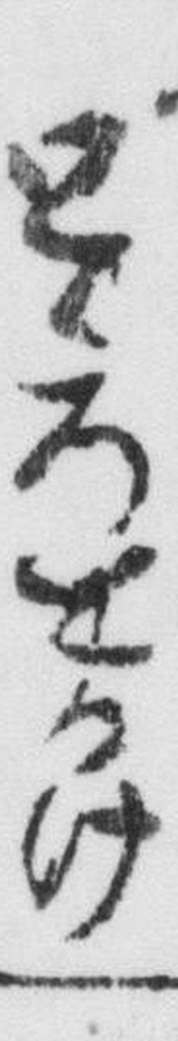とろをかけ
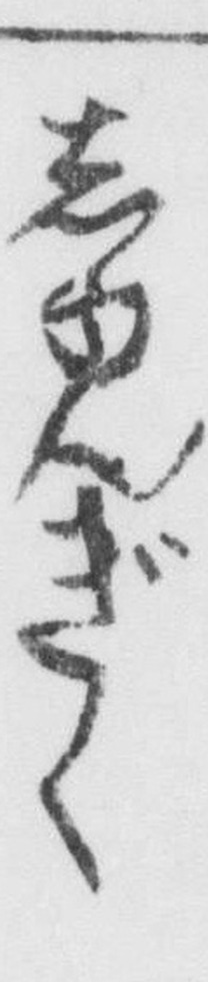しゆんぎく
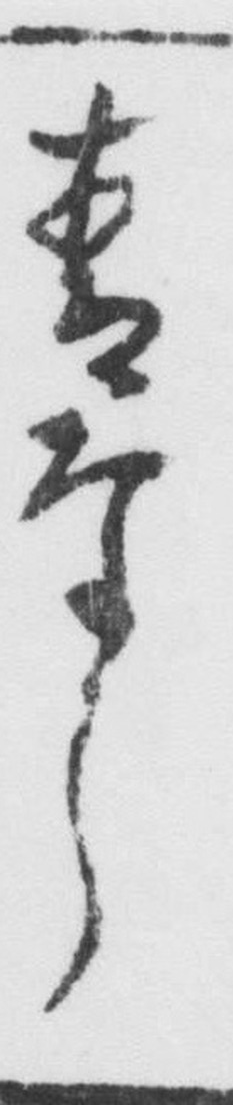走なし
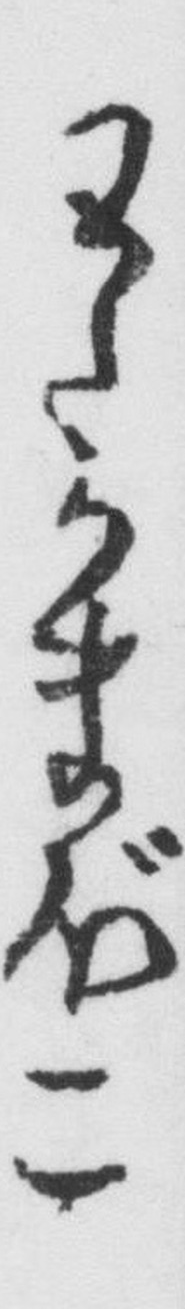わたかまぼこ
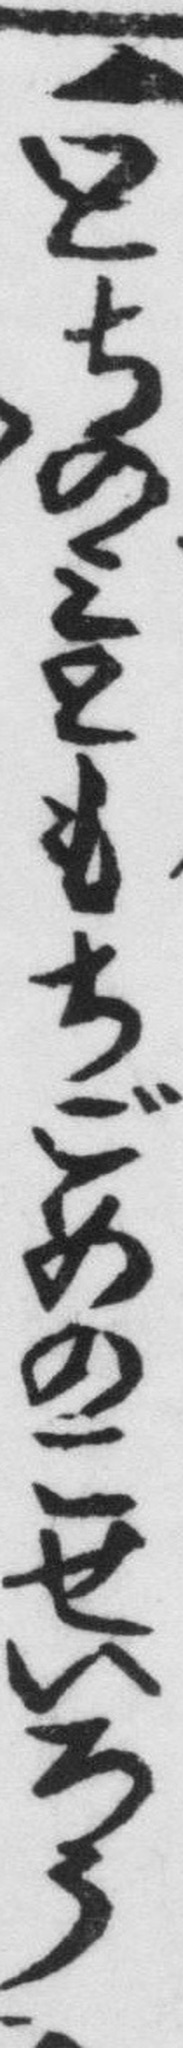▲とちのミともちごめのこせいろう
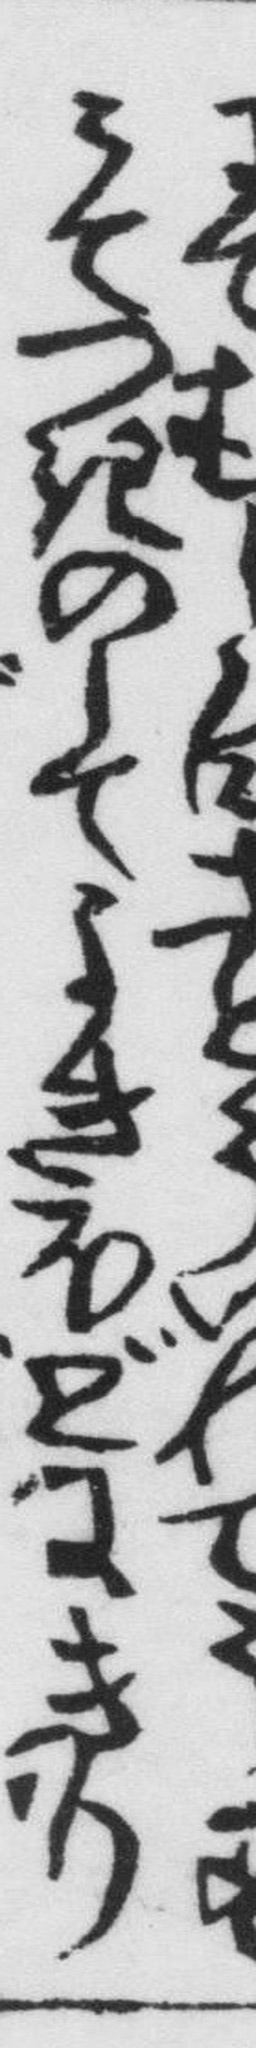うてつきのしてよきほどに
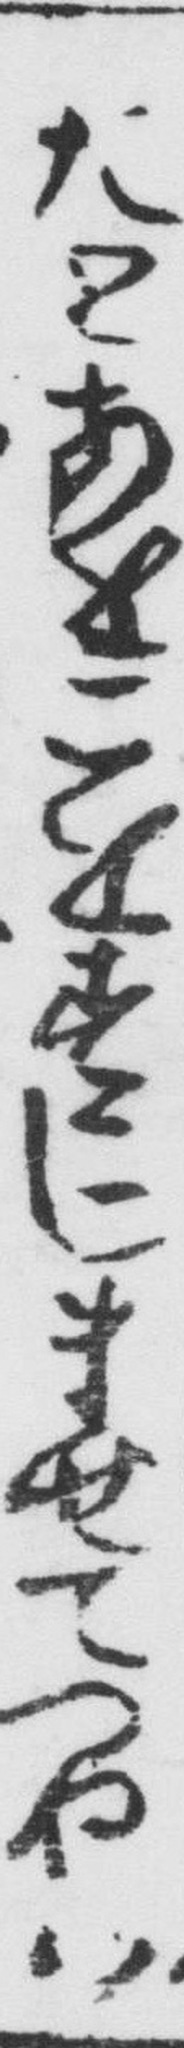たとあをこをすこしませてつねの
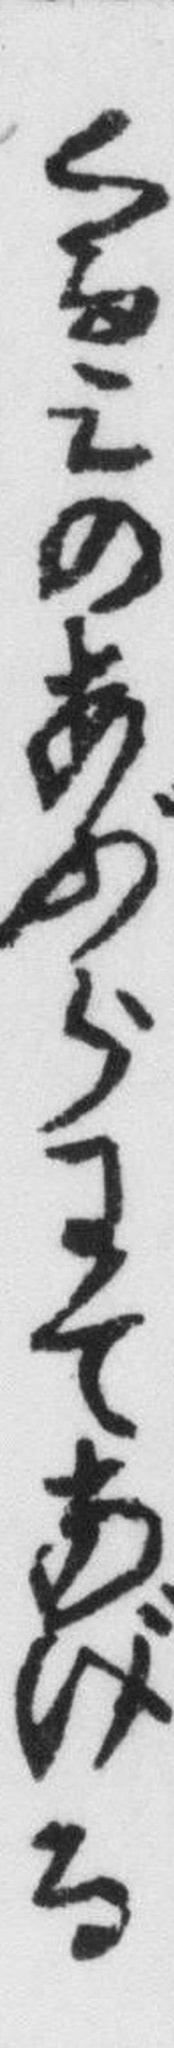きりくるミのあぶらにてあげる
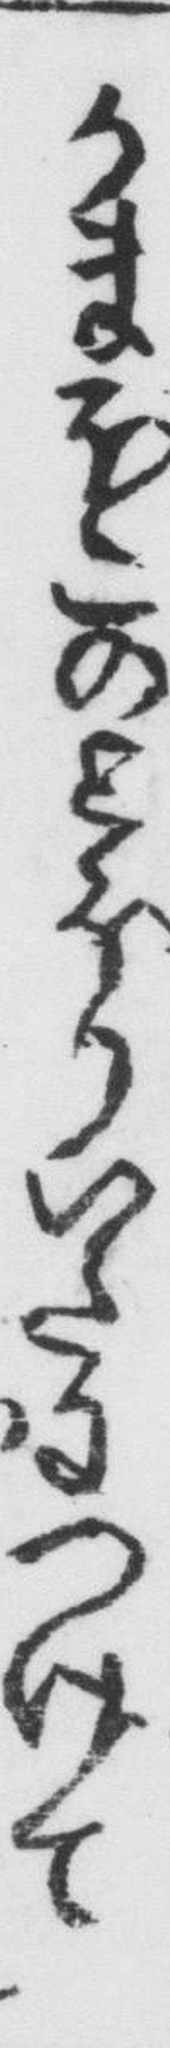かまほこのとほりいた手につけて
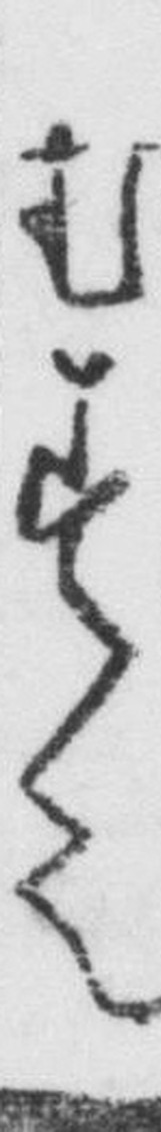むす也
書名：即席料理/早指南
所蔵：大阪府立大学学術情報センター 国文学研究資料館
